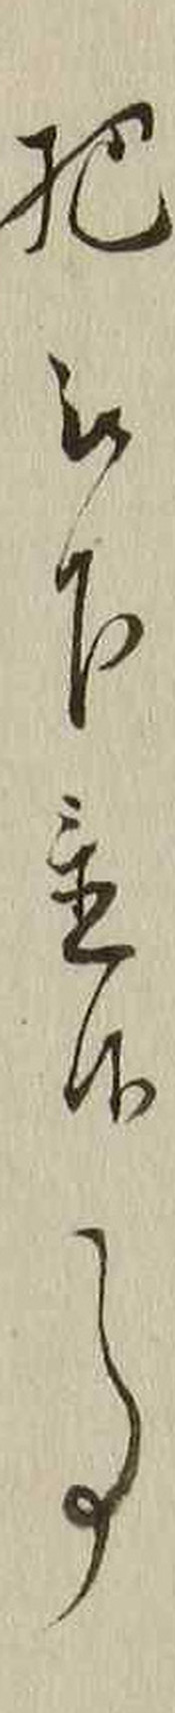把被下置候事
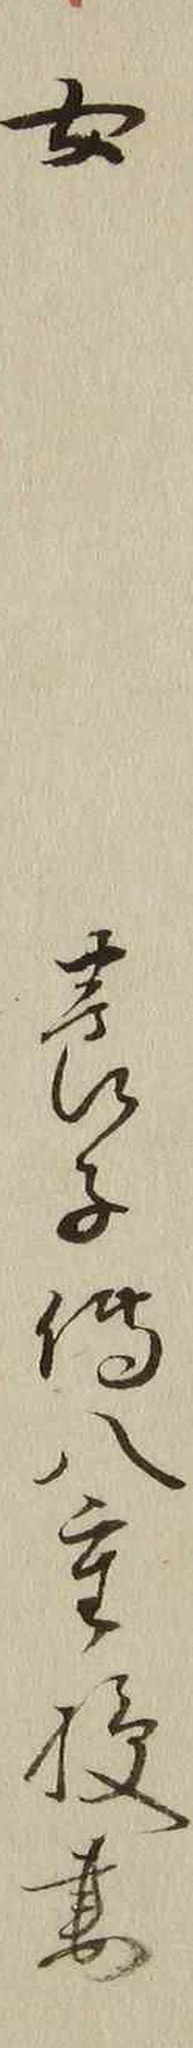女養子伝八重挍妻
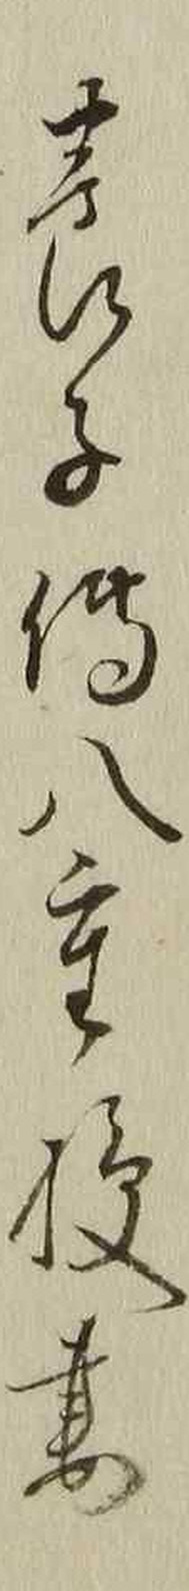女養子伝八重挍妻
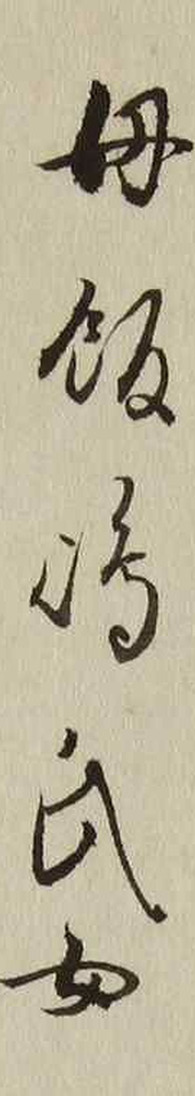母飯嶋氏女
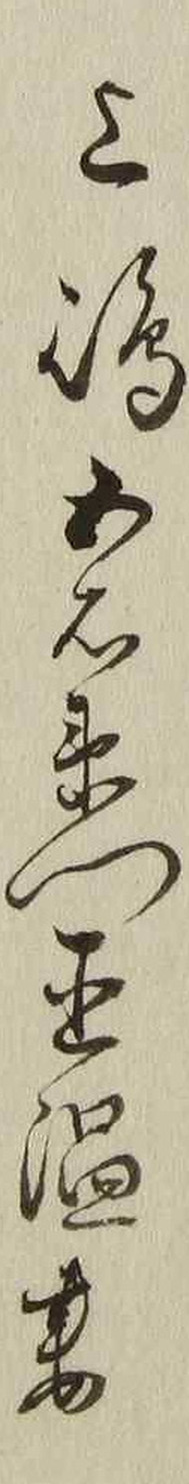女上嶋五右衛門直温妻
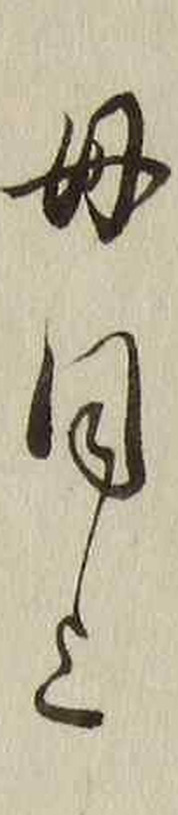母同上
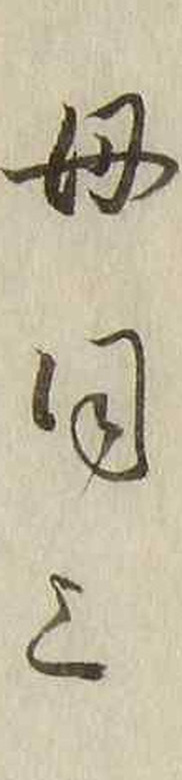母同上

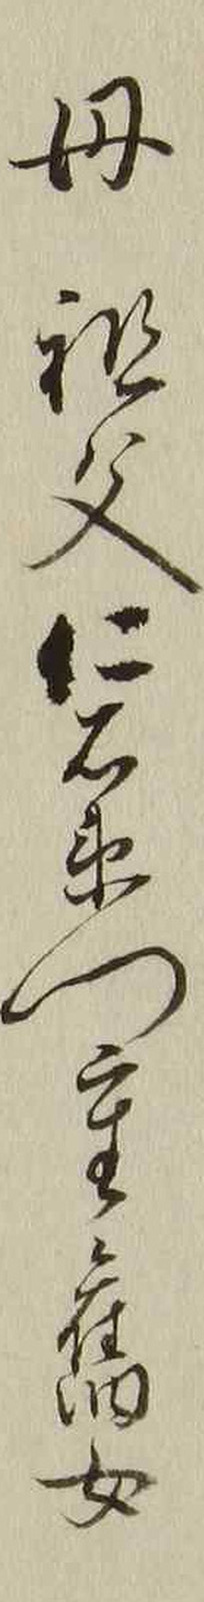母祖父仁右衛門重旧女
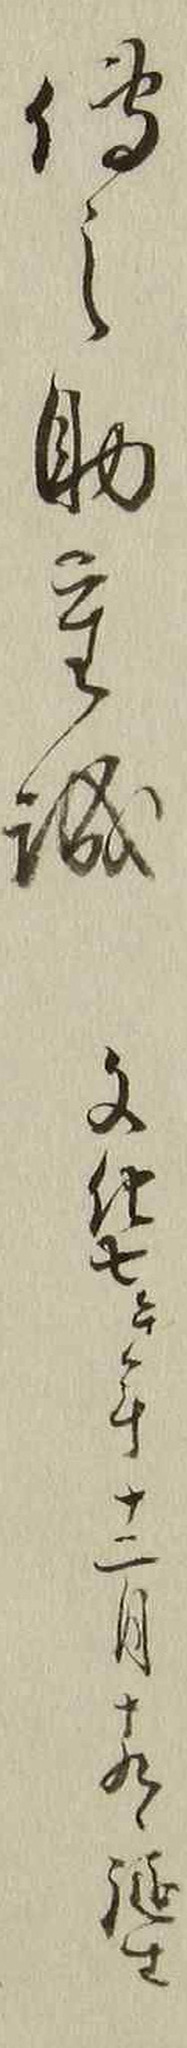伝之助重誠文化午年十二月十九日誕生
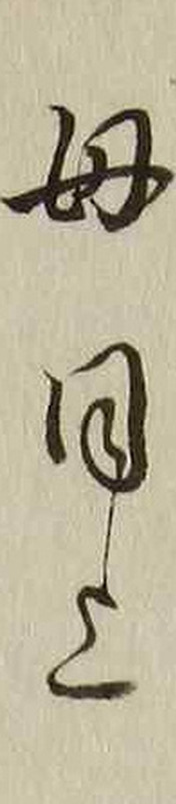母同上
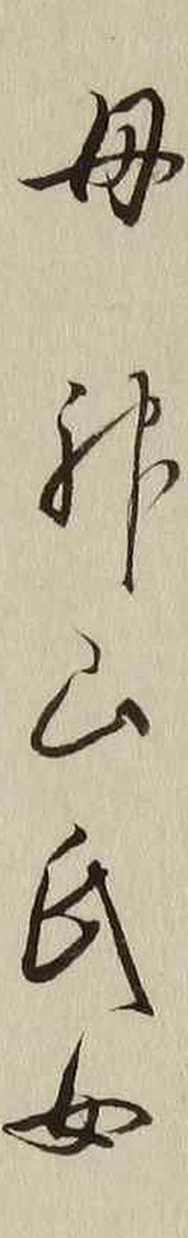母神山氏女
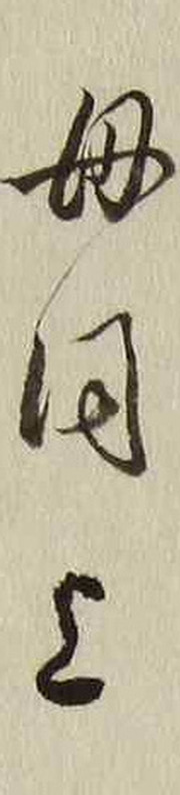母同上
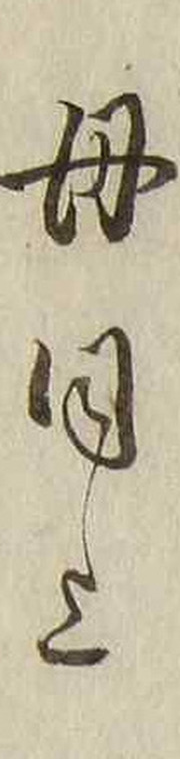母同上

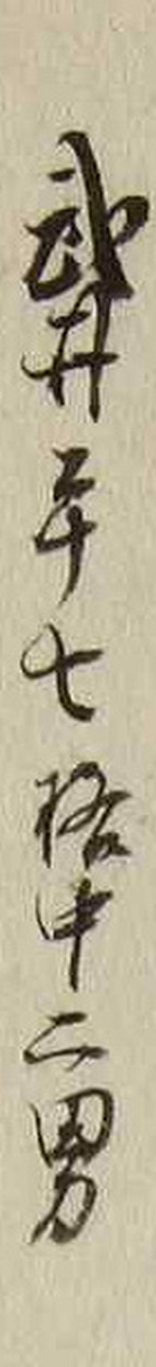武井平七格中二男
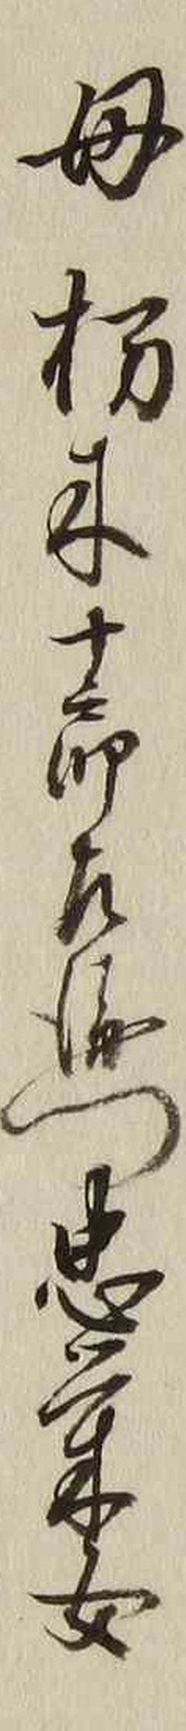母杤木十郎左衛門忠栄女
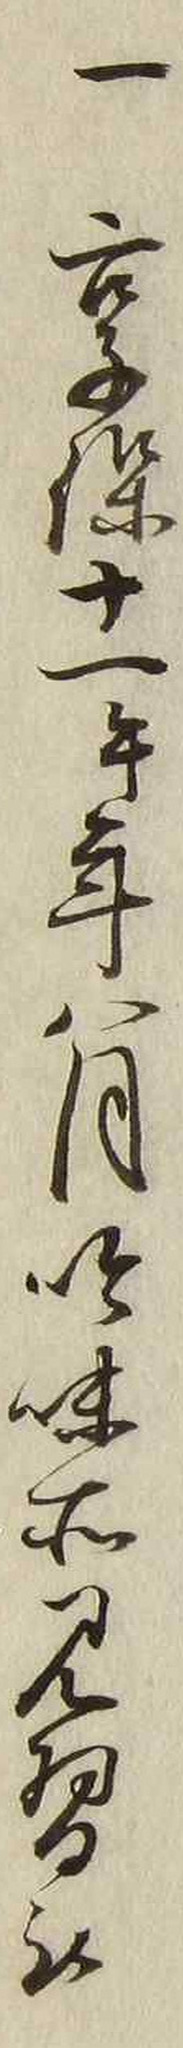一享保十一午年八月吟味所見習被
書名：諸士系譜　巻之129　た之部5
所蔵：会津若松市立会津図書館
